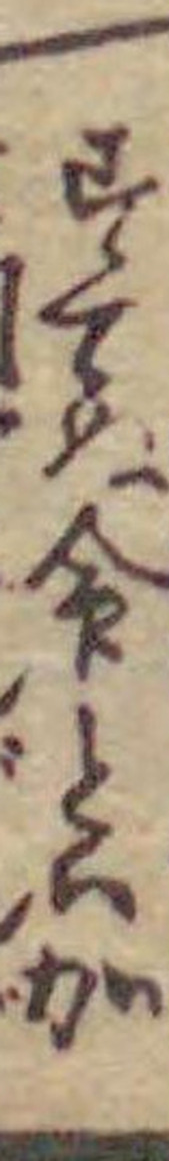すてぬ命とは加
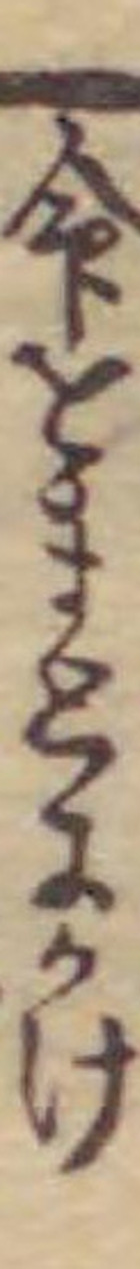命をまとにかけ
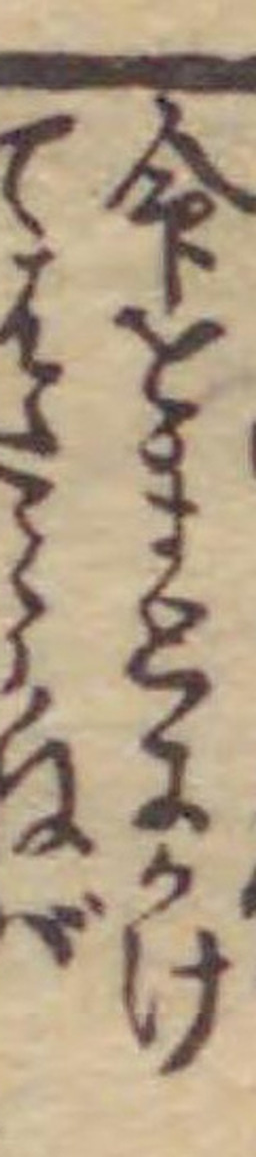てはたらかねば
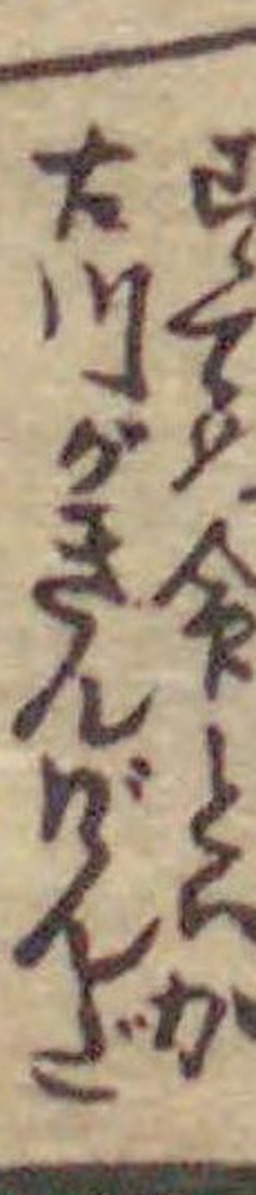右門がきんげんだ
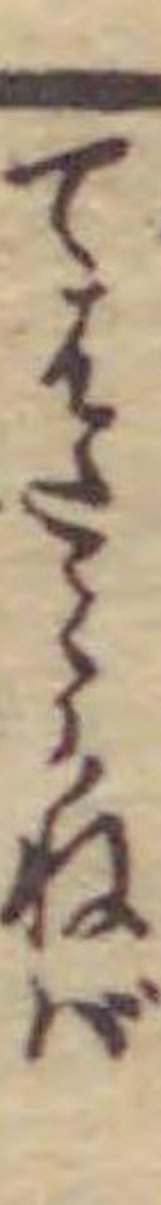てはたらかねば
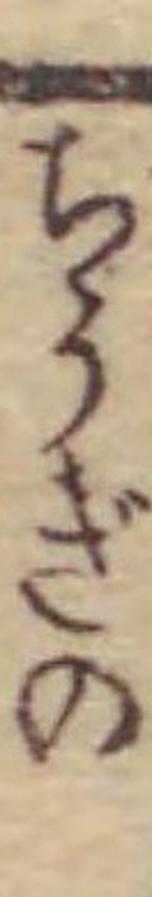ちうぎの
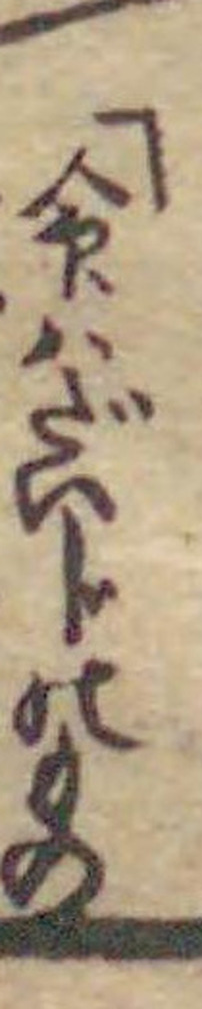〽命はだいじのもの
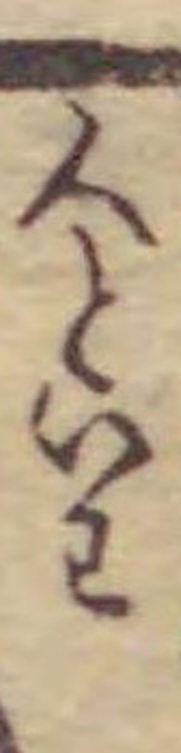人といわ
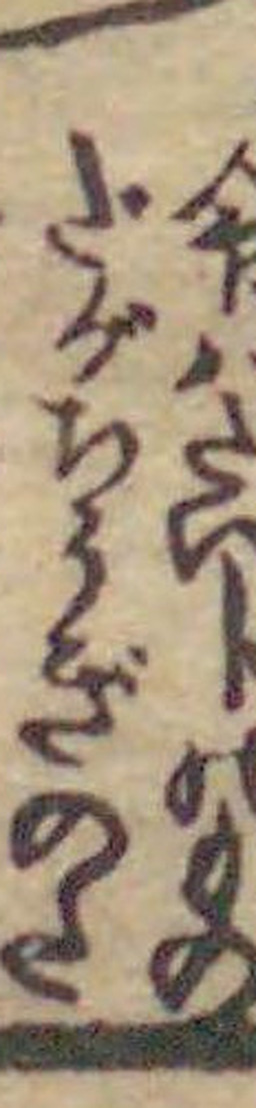だがちうぎのた
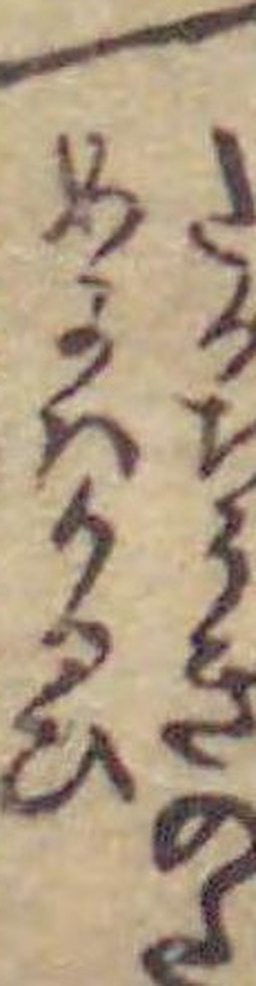めにはかるひ
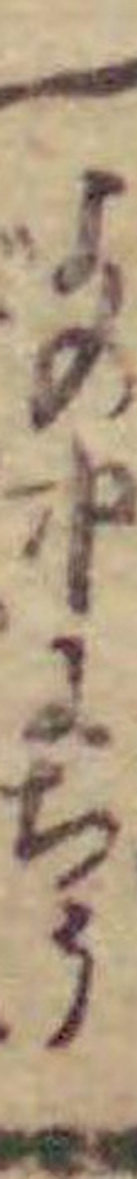よの中にちう
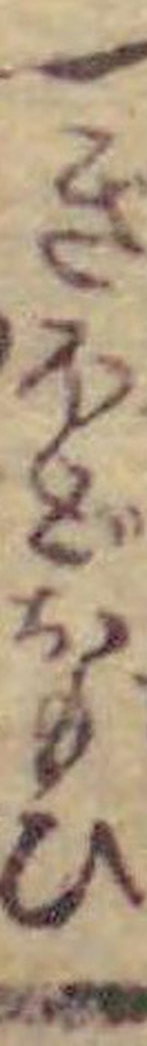ぎほどおもひ
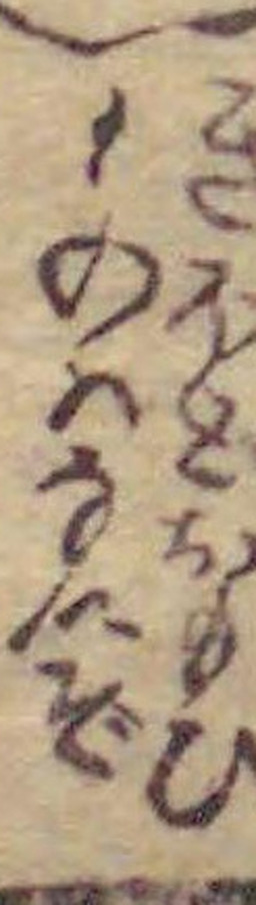ものはないぞ

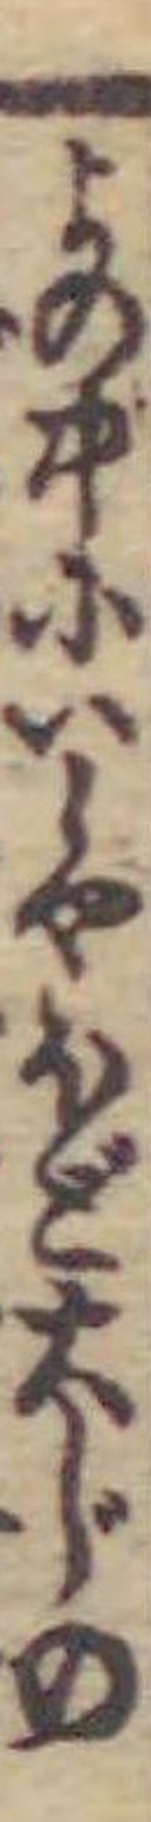よの中にいしやほど大じの
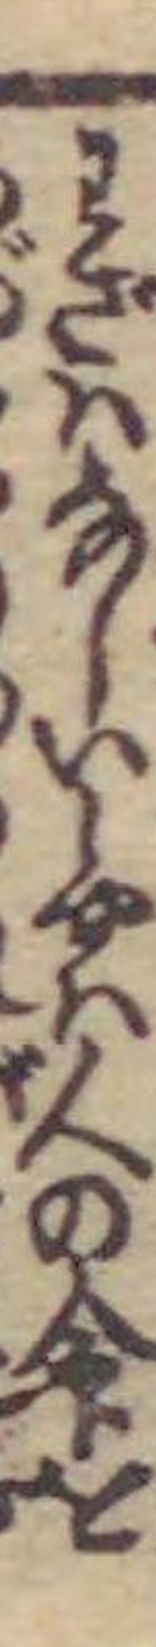わざはなしいしやは人の命を
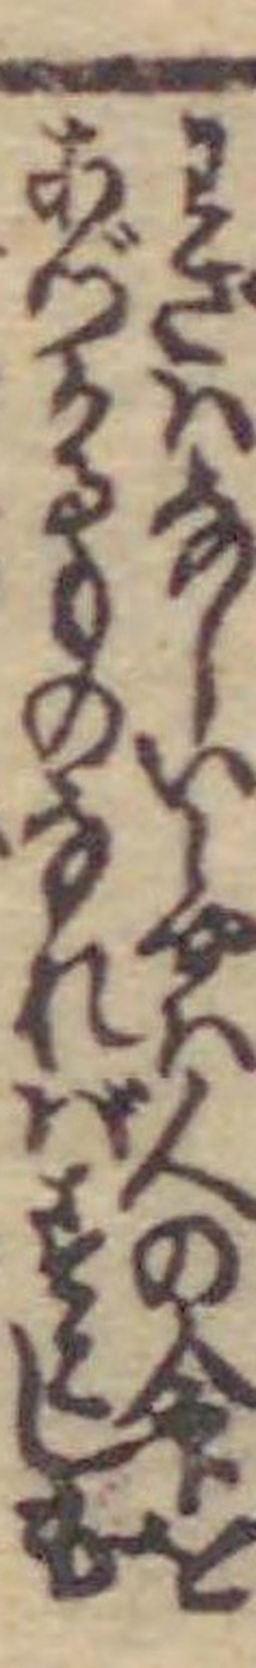あづかるものなればすこしも
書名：御誂染長寿小紋 : 3巻
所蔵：国立国会図書館 National Diet Library, JAPAN
